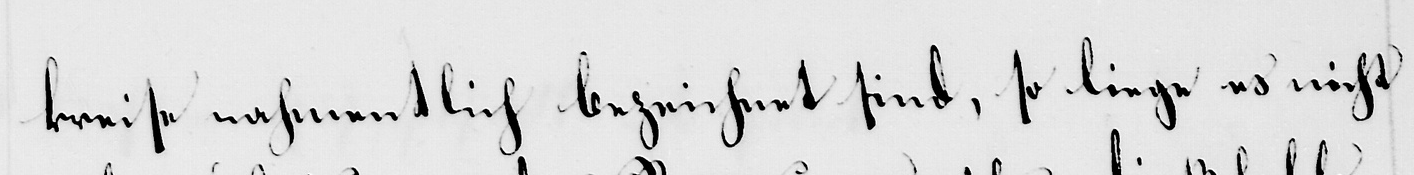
kreise nahmentlich bezeichnet sind, so liege es nicht
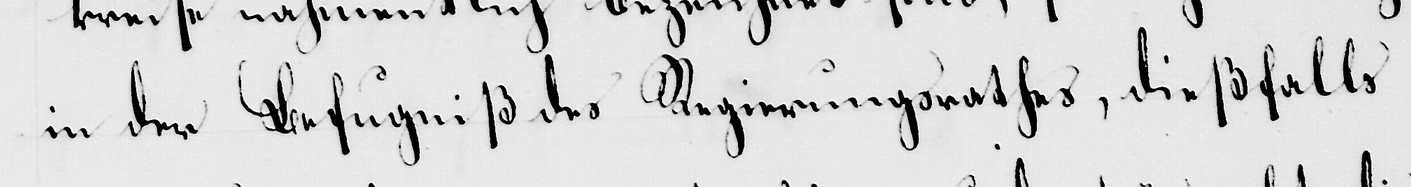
in der Befugniß des Regierungsrathes, dießfalls
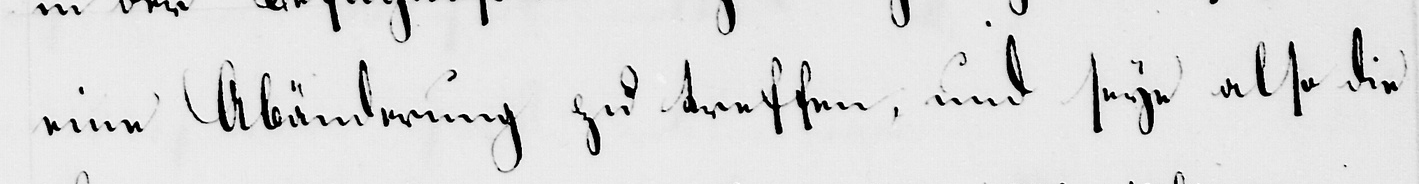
eine Abänderung zu treffen, und seye also die
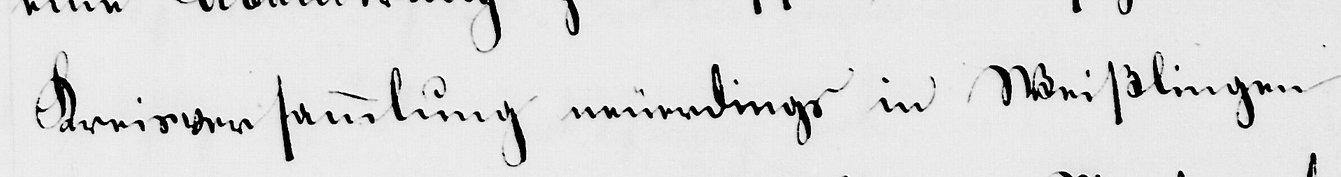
Kreisversammlung neuerdings in Weisslingen
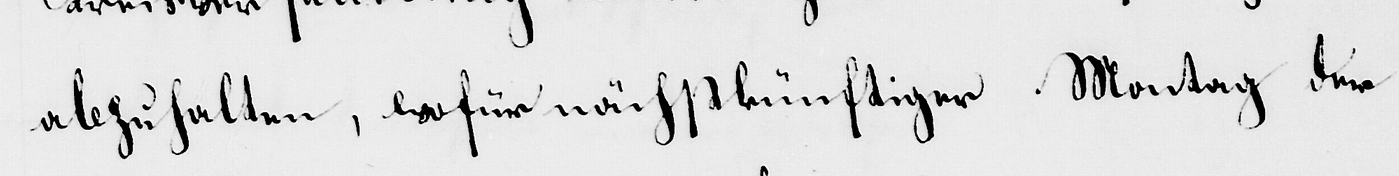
abzuhalten, wofür nächstkünftiger Montag der
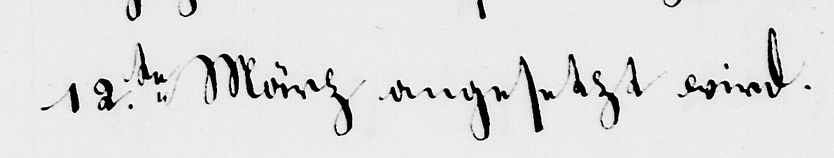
12.te März angesetzt wird.
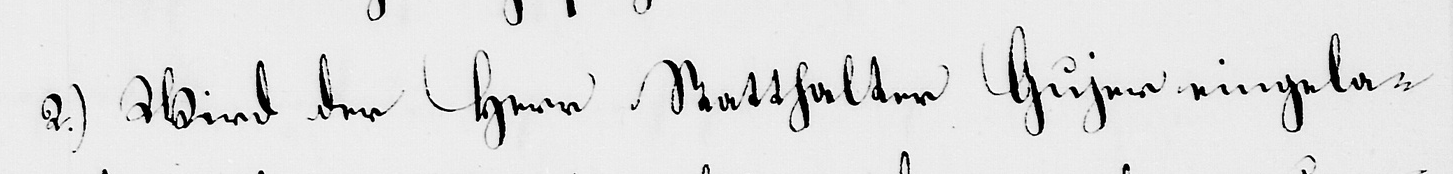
2.) Wird der Herr Statthalter Gujer eingela¬
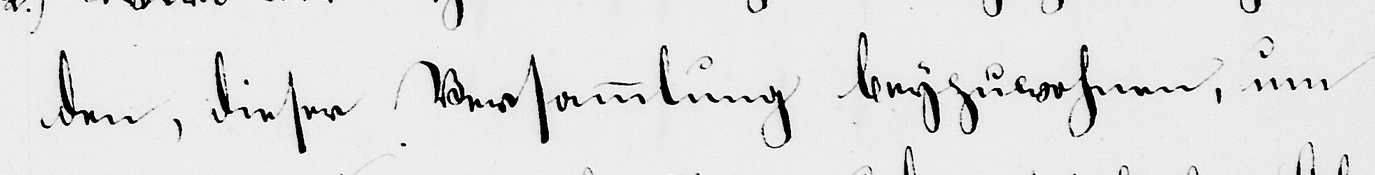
den, dieser Versammlung beyzuwohnen, um
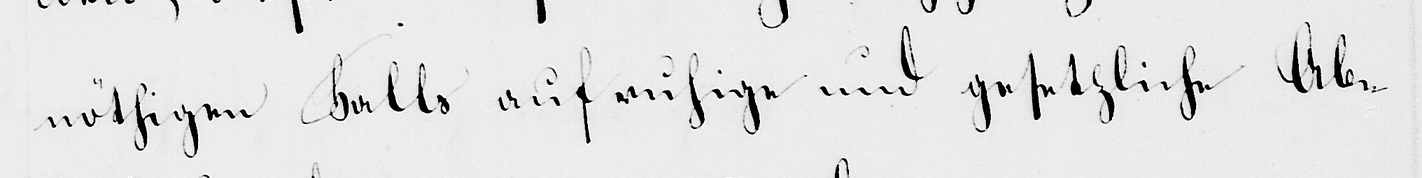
nöthigen Falls auf ruhige und gesetzliche Ab¬
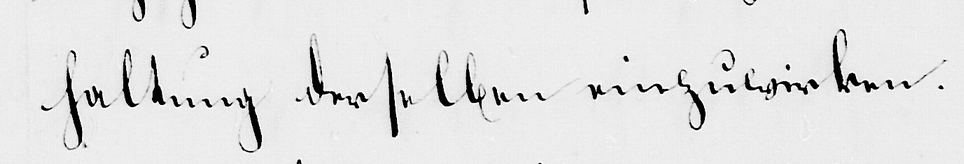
haltung derselben einzuwirken.
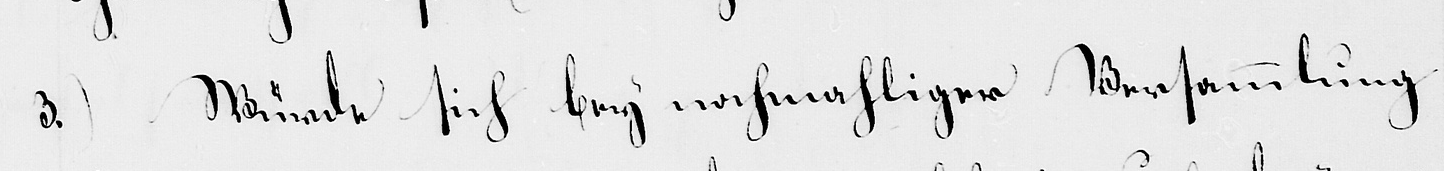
3.) Würde sich bey nachmahliger Versammlung
